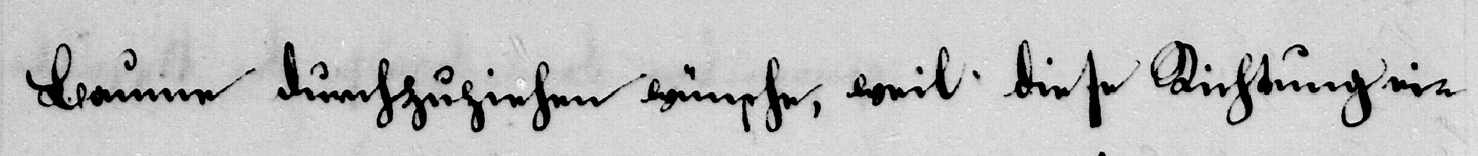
Baume durchzuziehen wünsche, weil diese Richtung ei¬
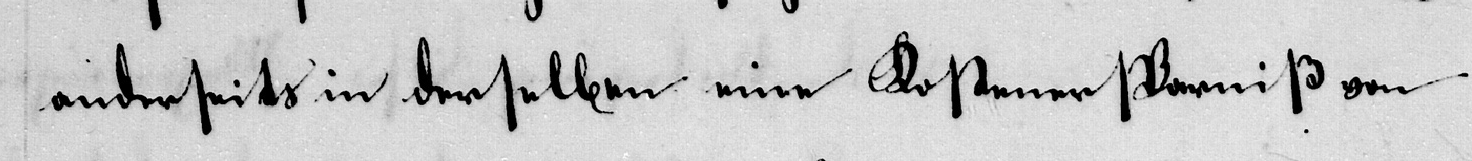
anderseits in derselben eine Kostenersparniß von
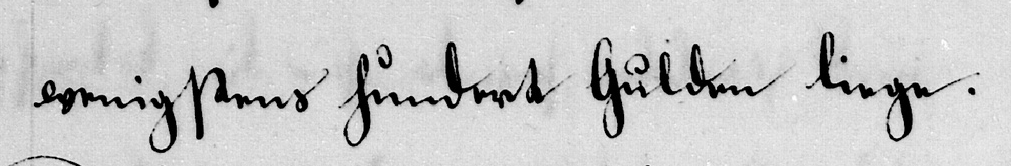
wenigstens hundert Gulden liege.
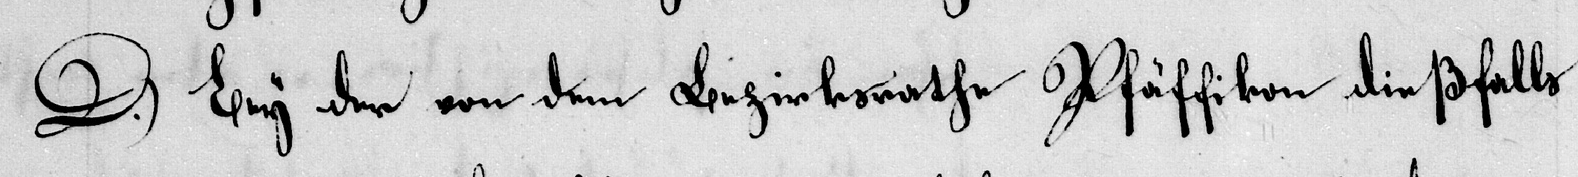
D.) Bey der von dem Bezirksrathe Pfäffikon dießfalls
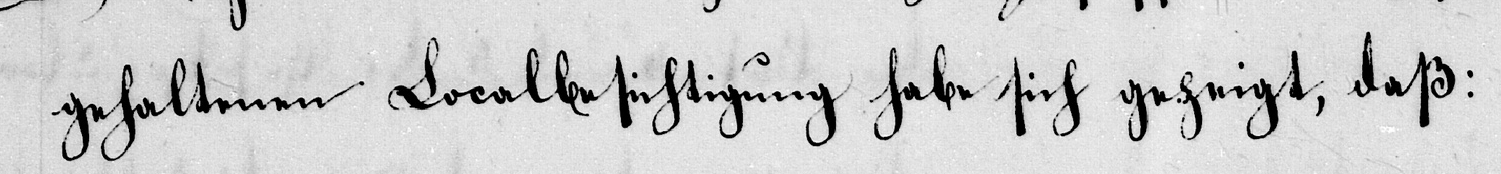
gehaltenen Localbesichtigung habe sich gezeigt, daß:
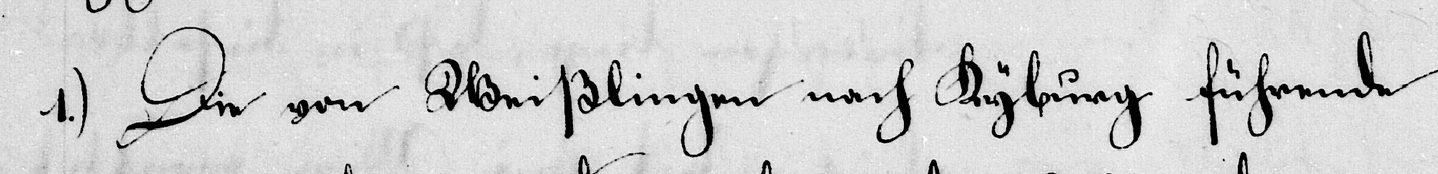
1.) Die von Weißlingen nach Kyburg führende
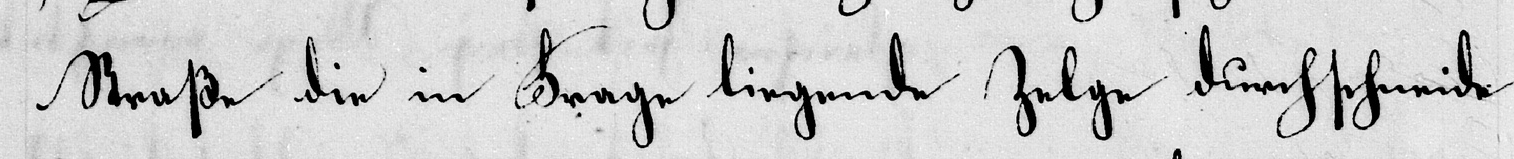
Straße die in Frage liegende Zelge durchschneide
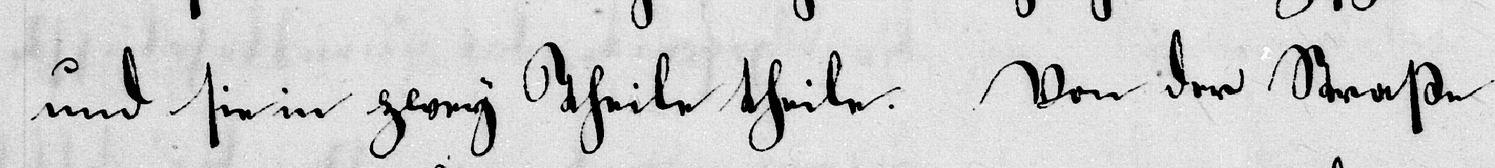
und sie in zwey Theile theile. Von der Straße
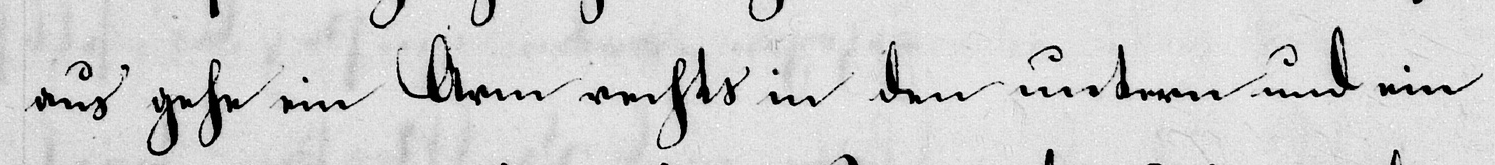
aus gehe ein Arm rechts in den Untern und ein
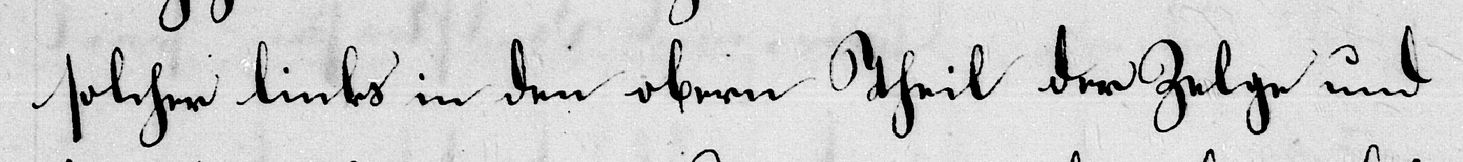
solcher links in den obern Theil der Zelge und
